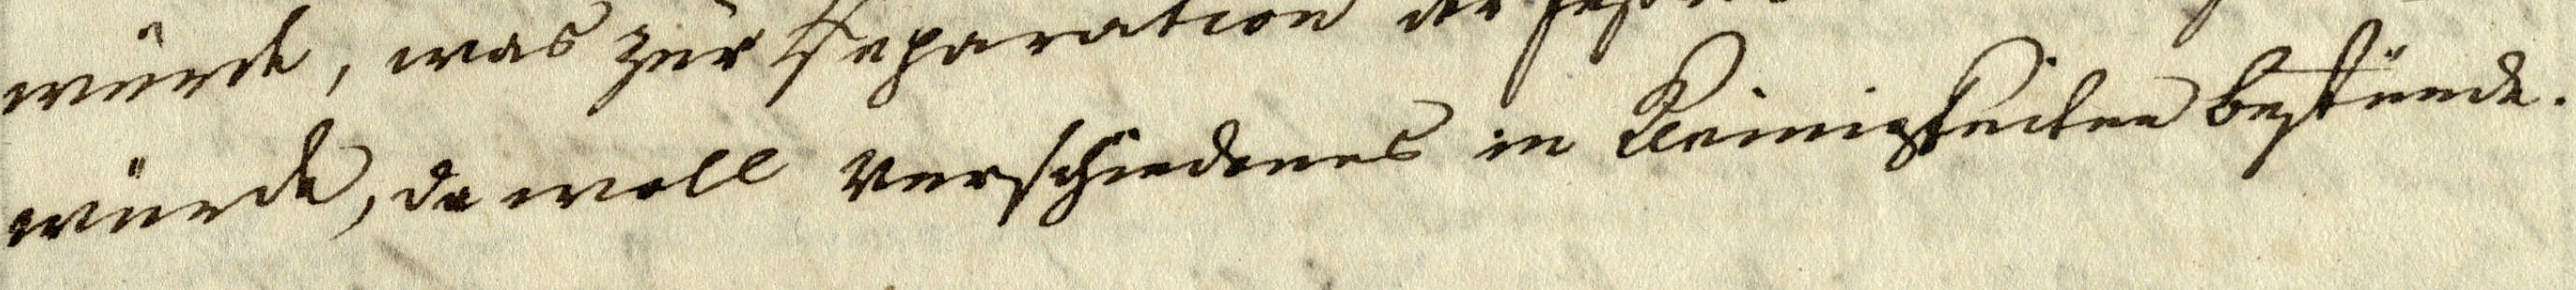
würde, da woll Verschiedenes in Kleinigkeiten bestünde.
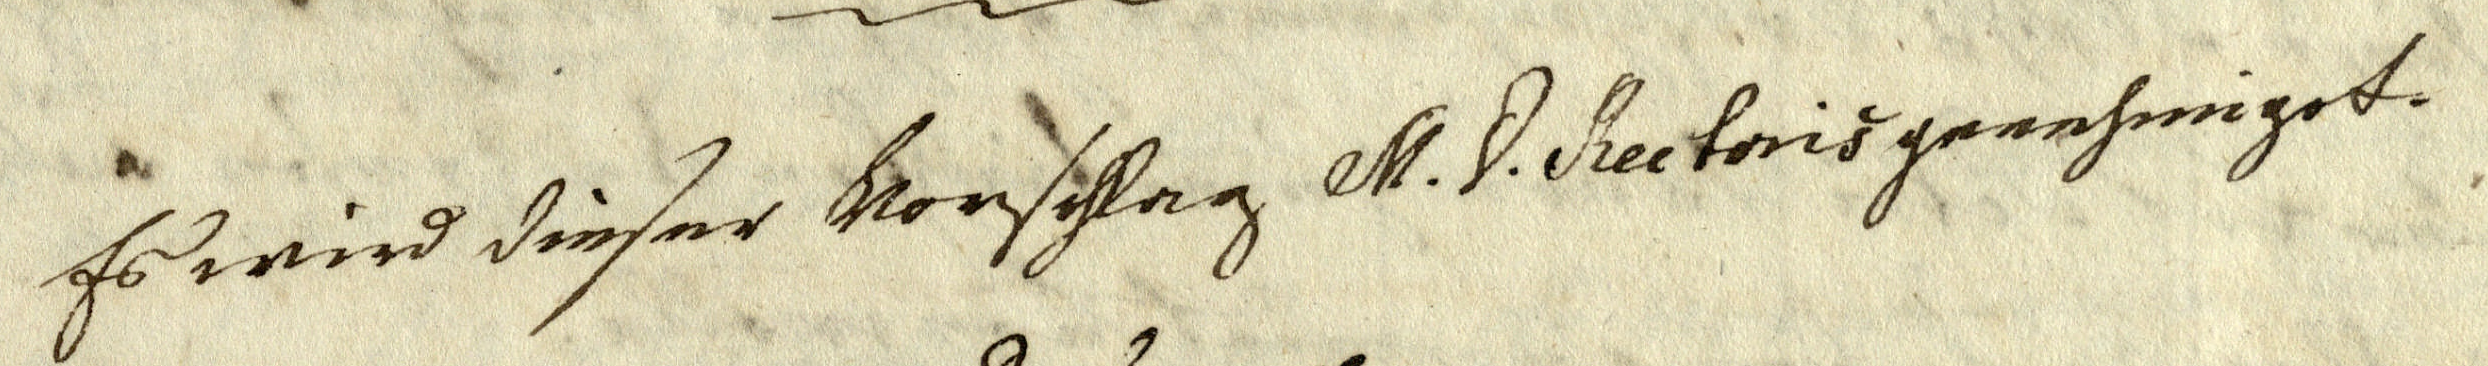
Es wird dieser Vorschlag M. D. Rectoris genehmiget.
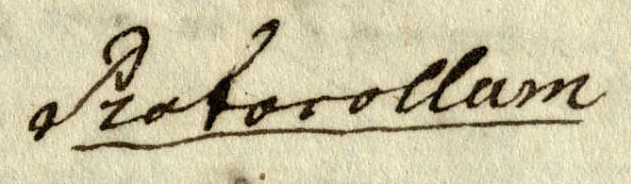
Protocollum
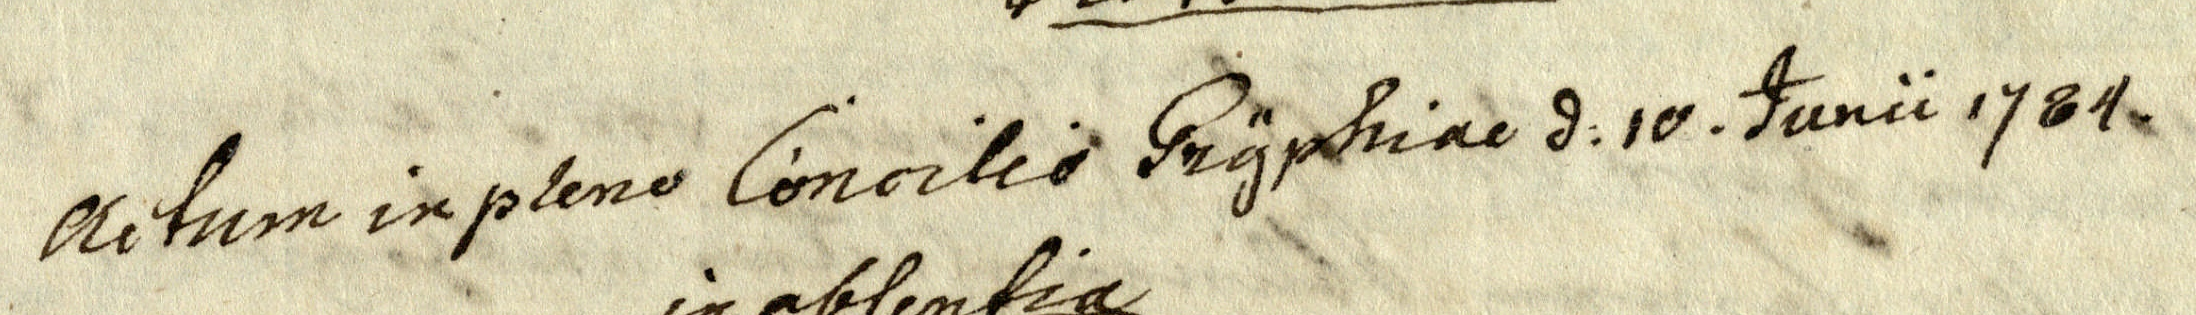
Actum in pleno Concilio Gryphiae d. 10. Junii 1784.
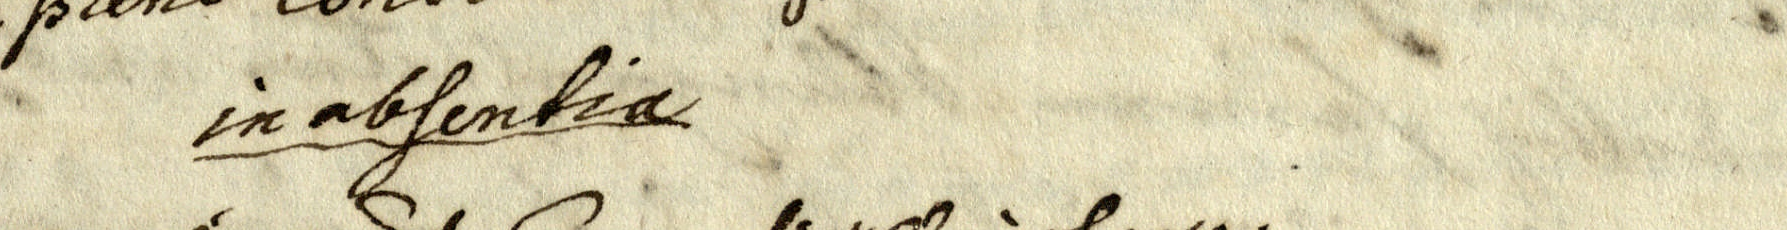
in absentia
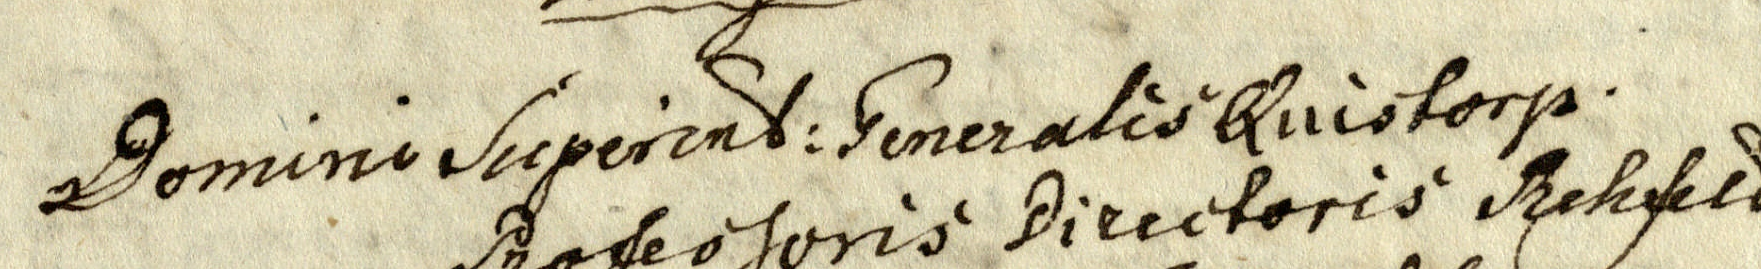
Domini Superint. Generalis Quistorp
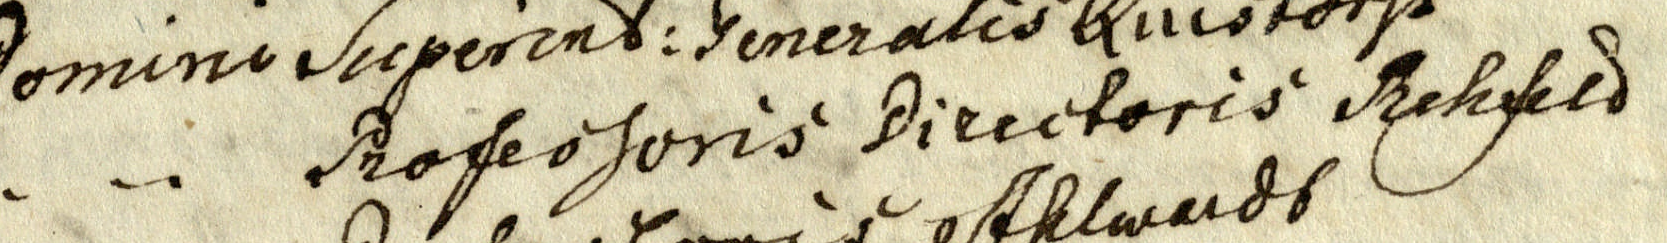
Professoris, Directoris Rehfeld.
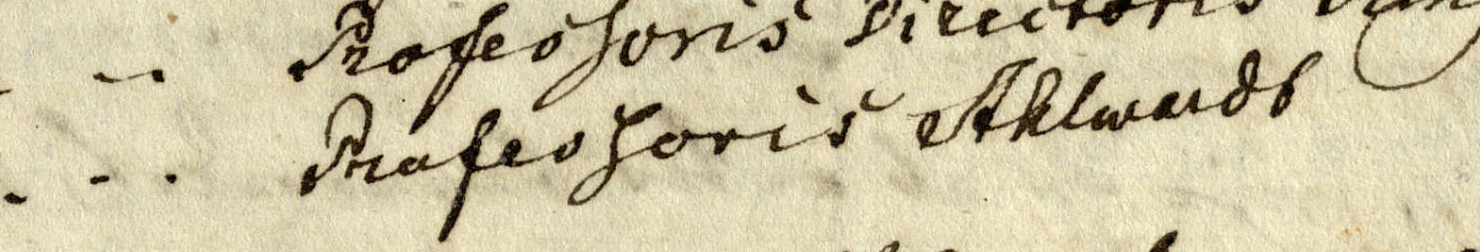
Professoris Ahlwardt.
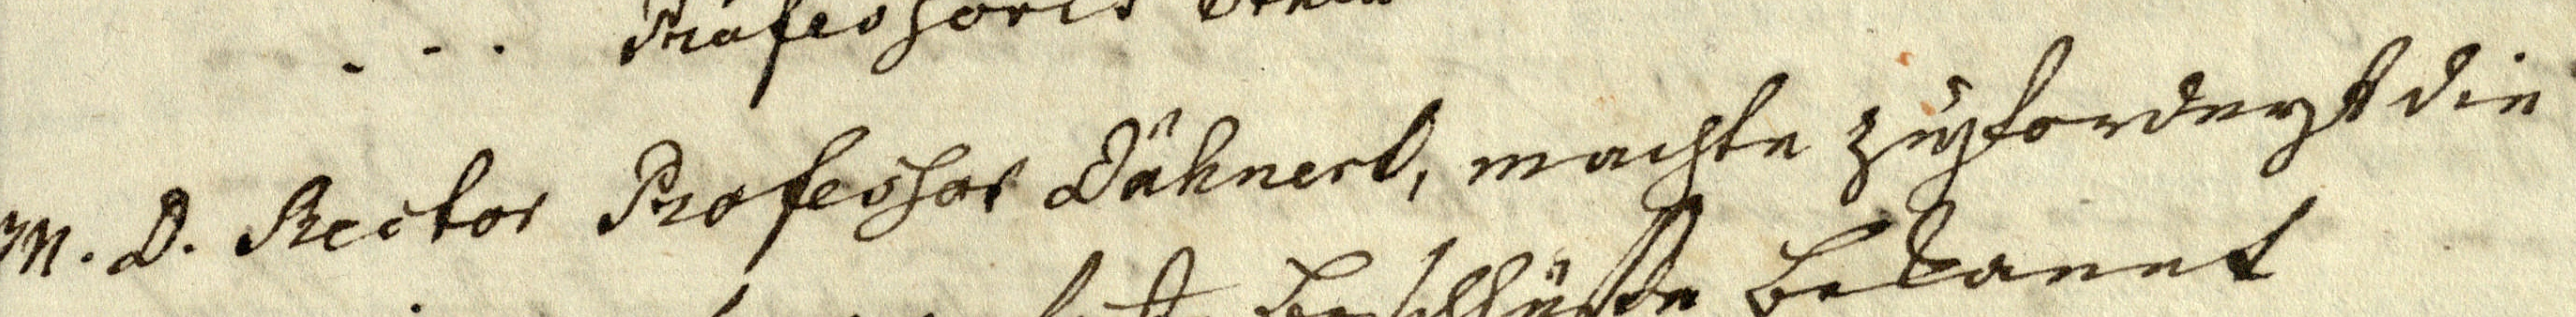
M. D. Rector Professor Dähnert, machte zuforderst die
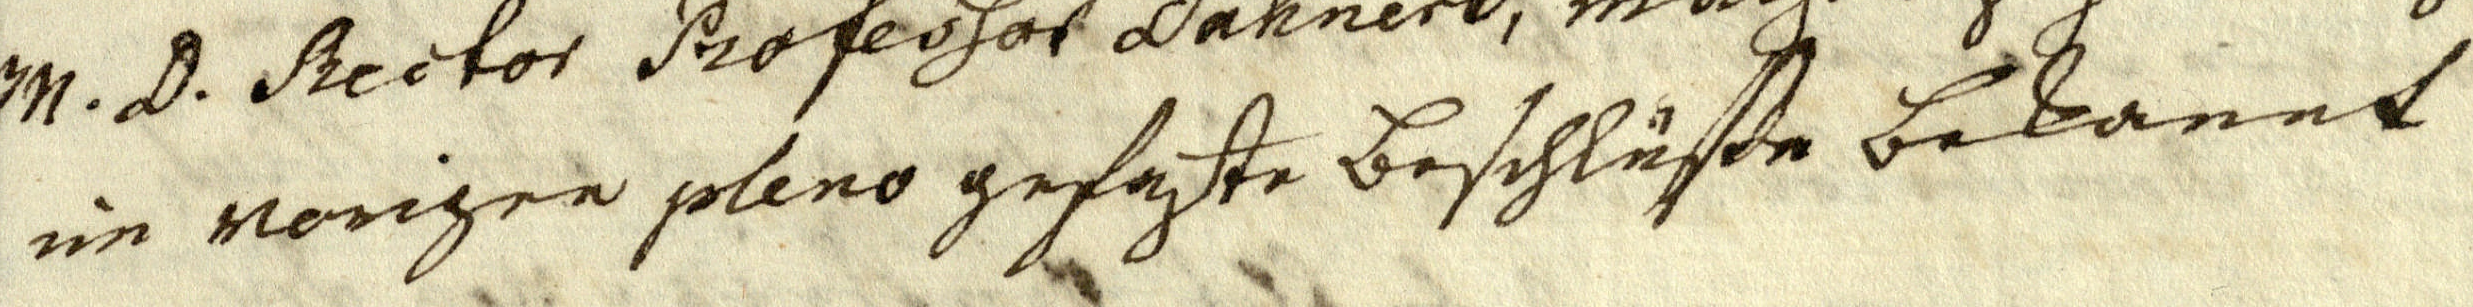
im vorigen pleno gefaste Beschlüße bekannt.
